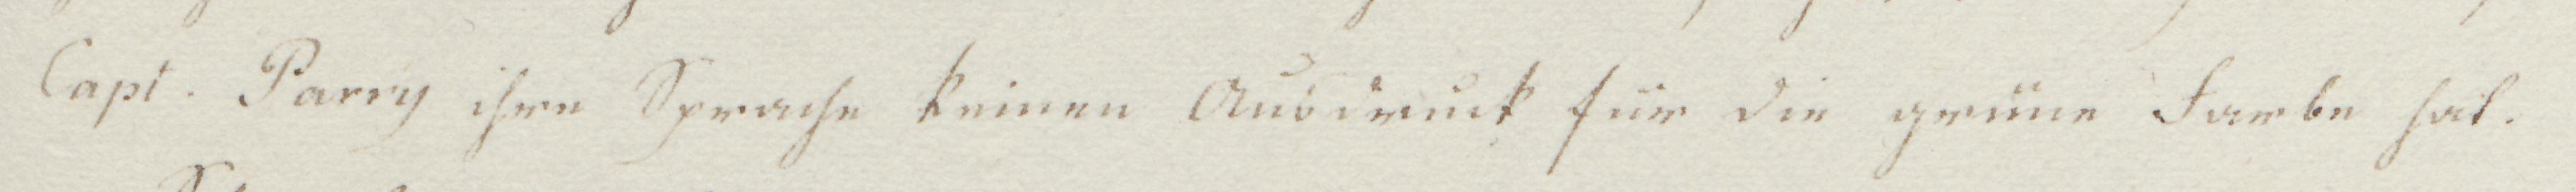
Capt. Parry ihre Sprache keinen Ausdruck für die grüne Farbe hat.
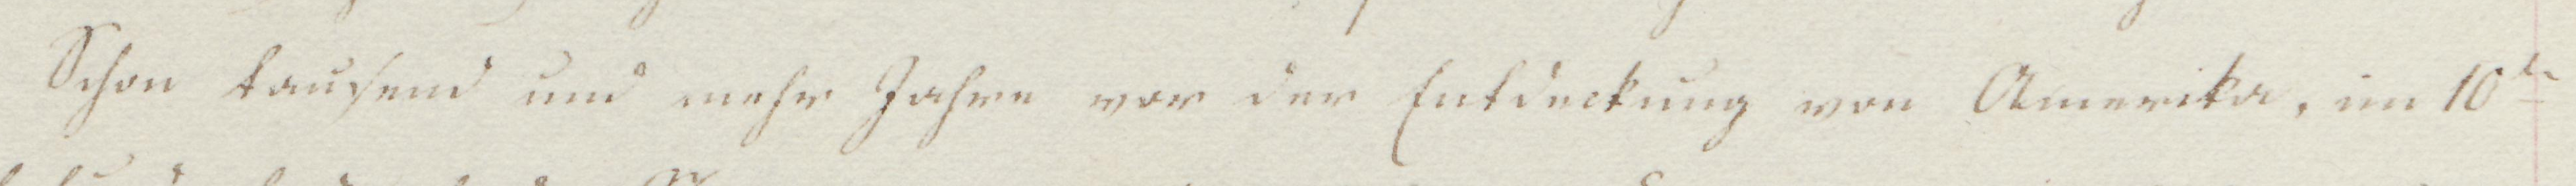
Schon tausend und mehr Jahre vor der Entdeckung von Amerika, im 10￼
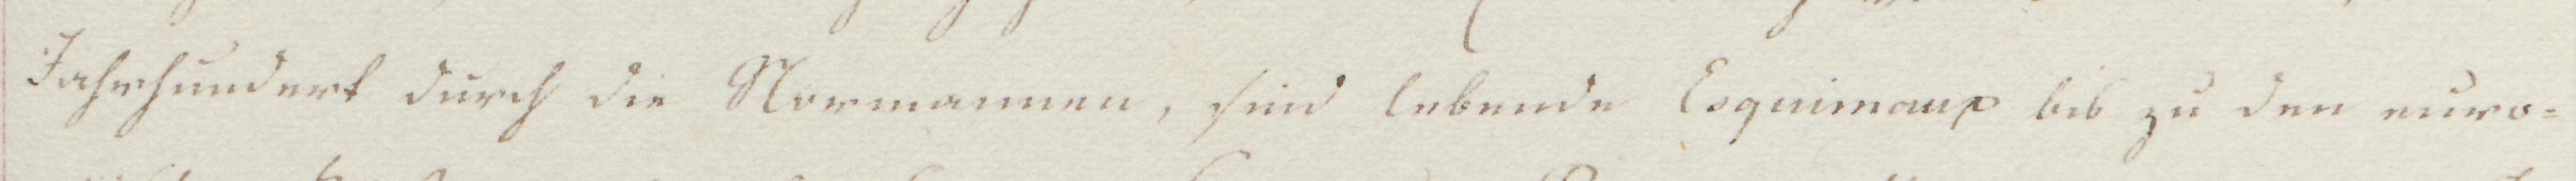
Jahrhundert durch die Normannen, sind lebende Esquimaux bis zu den euro-
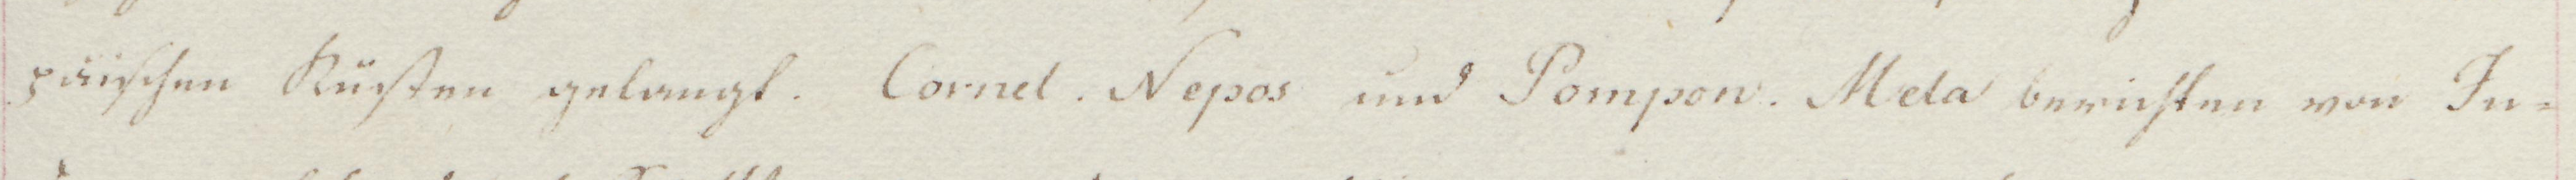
päischen Küsten gelangt. Cornel. Nepos und Pompon. Mela berichten von In-
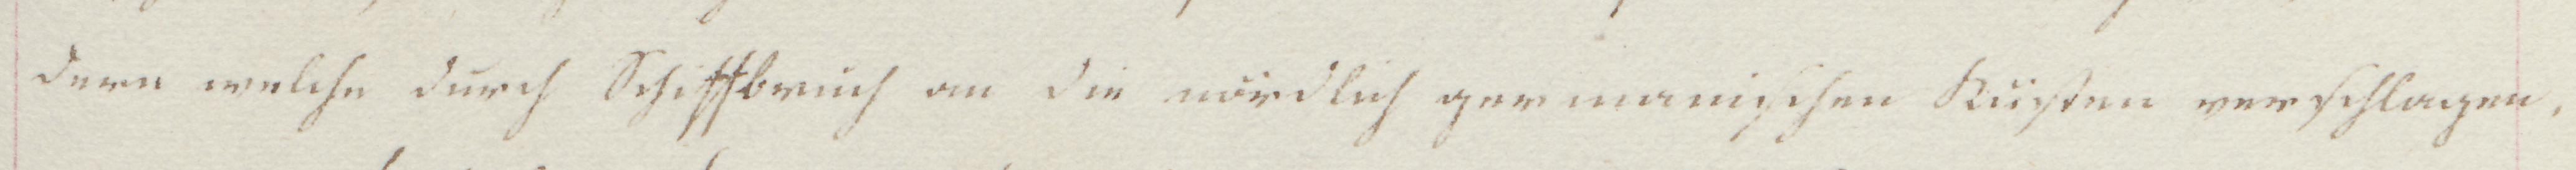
dern welche durch Schiffbruch an die nördlich germanischen Küsten verschlagen,
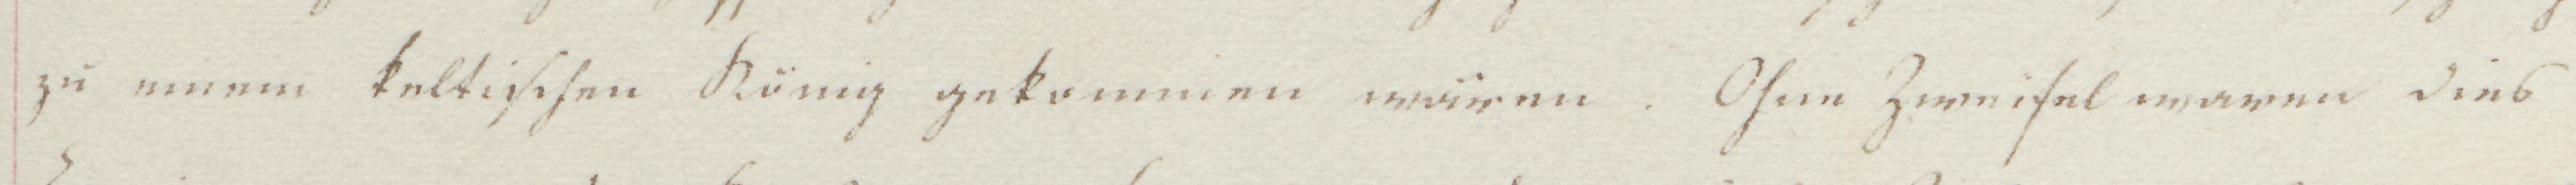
zu einem keltischen König gekommen wären. Ohne Zweifel waren dies
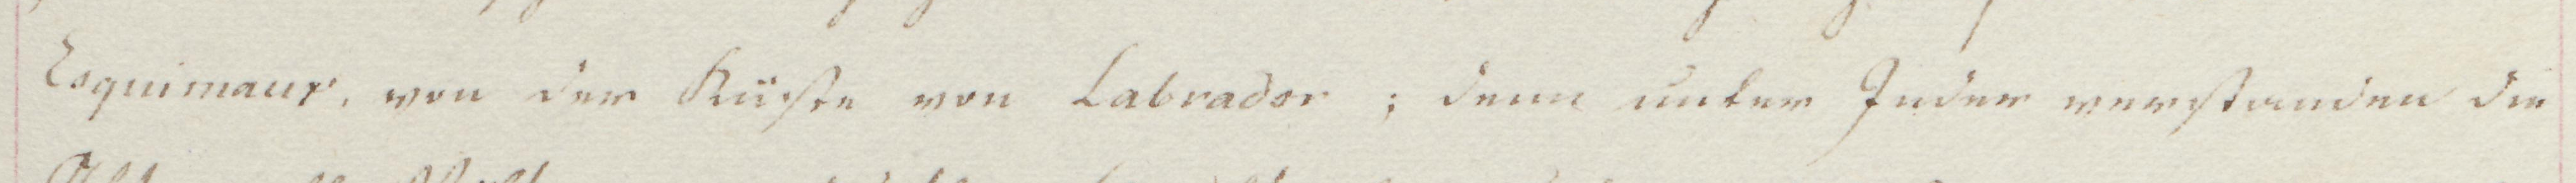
Esquimaux, von der Küste von Labrador; denn unter Inder verstanden die
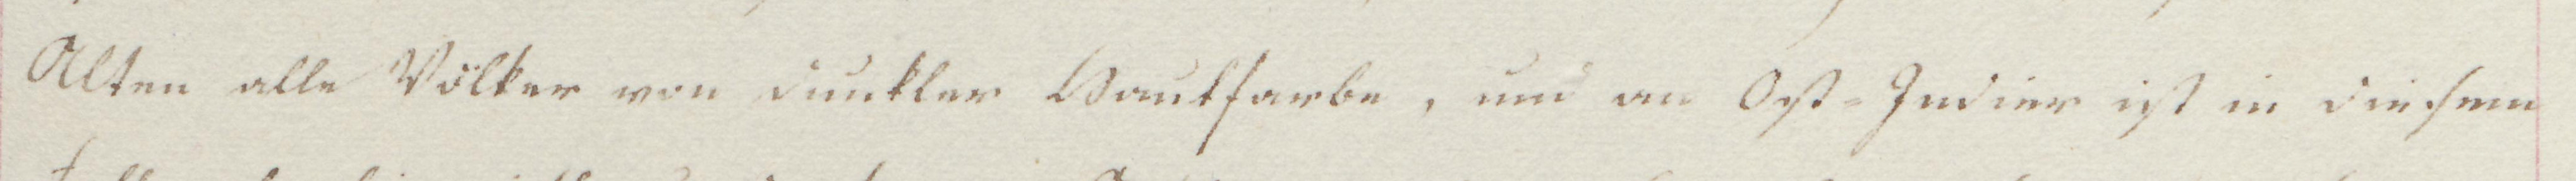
Alten alle Völker von dunkler Hautfarbe, und an Ost-Indier ist in diesem
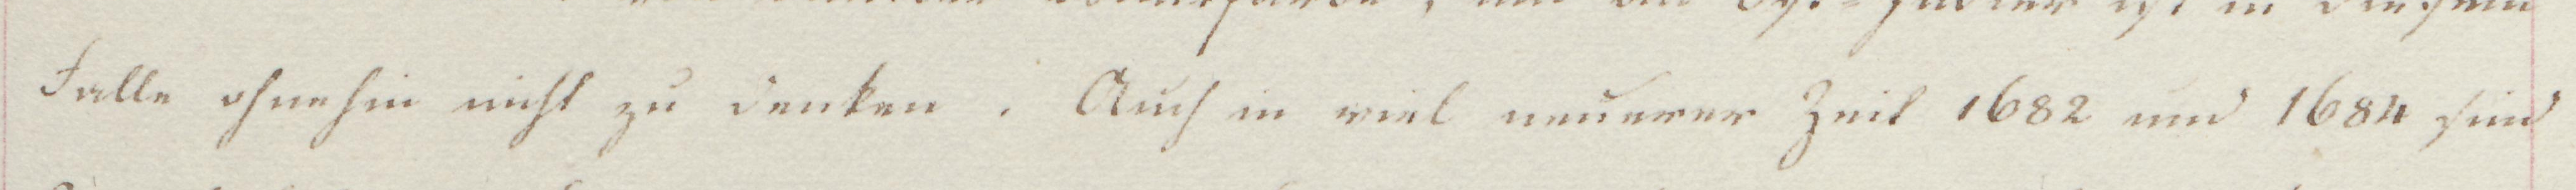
Falle ohnehin nicht zu denken. Auch in viel neuerer Zeit 1682 und 1684 sind
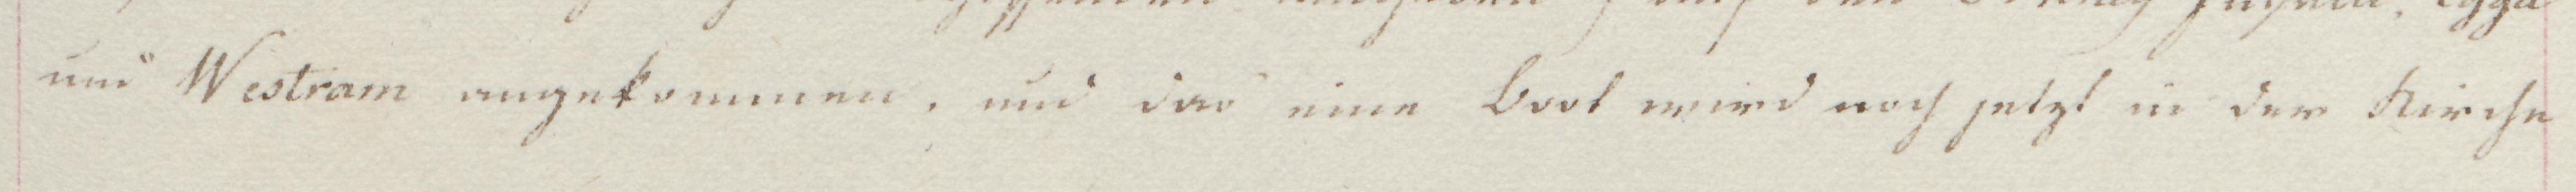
und Westram angekommen, und das eine Boot wird noch jetzt in der Kirche
